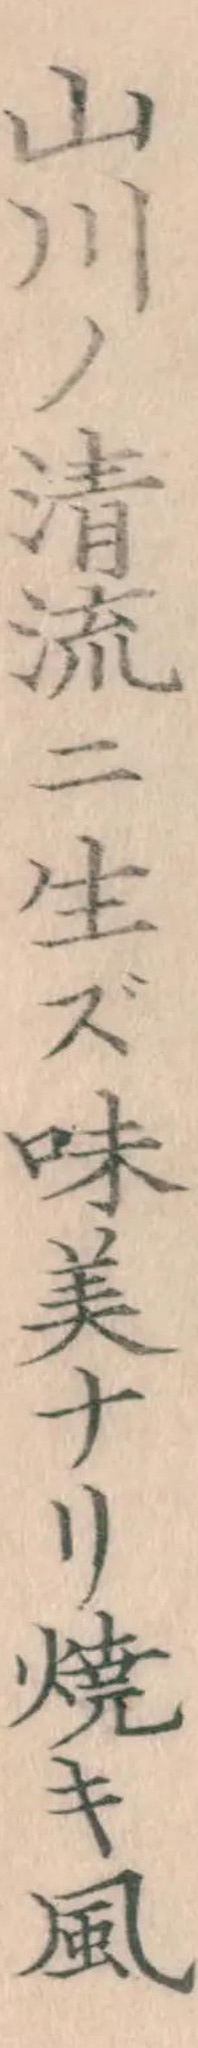山川ノ清流ニ生ズ味美ナリ焼キ風
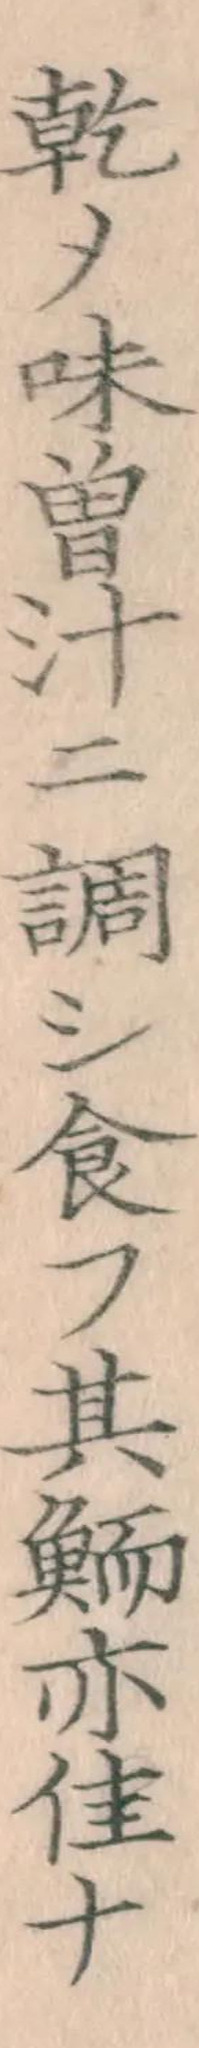乾シテ味噌汁ニ調シ食フ其鮞亦佳ナ
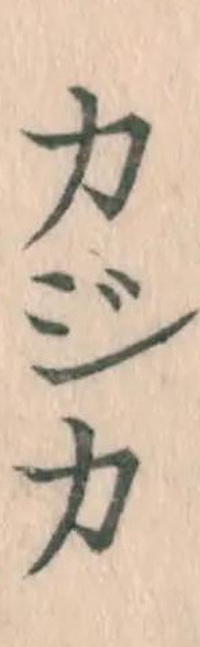カジカ
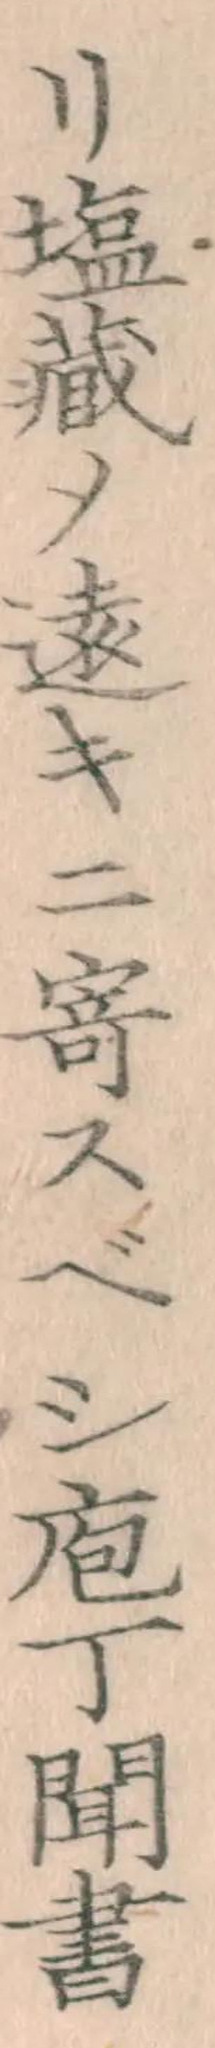リ塩蔵シテ遠キニ寄スベシ庖丁聞書
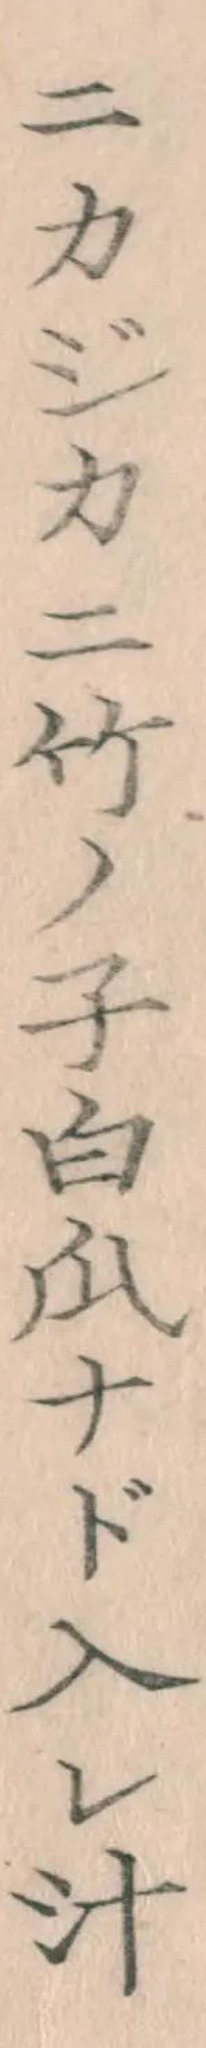ニカジカニ竹ノ子白瓜ナド入レ汁
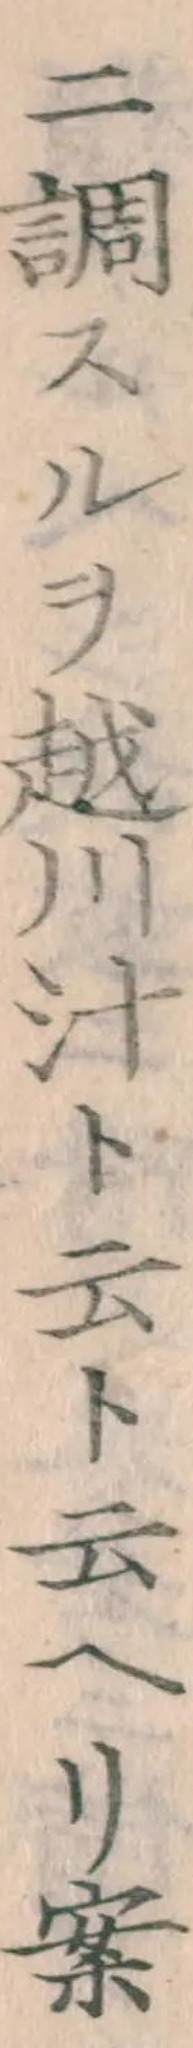ニ調スルヲ越川汁ト云ト云ヘリ案
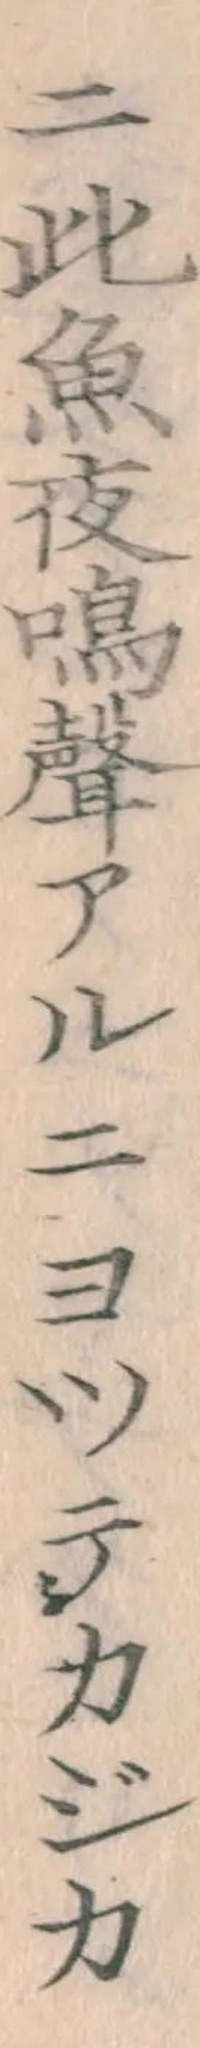ニ此魚夜鳴声アルニヨツテカジカ
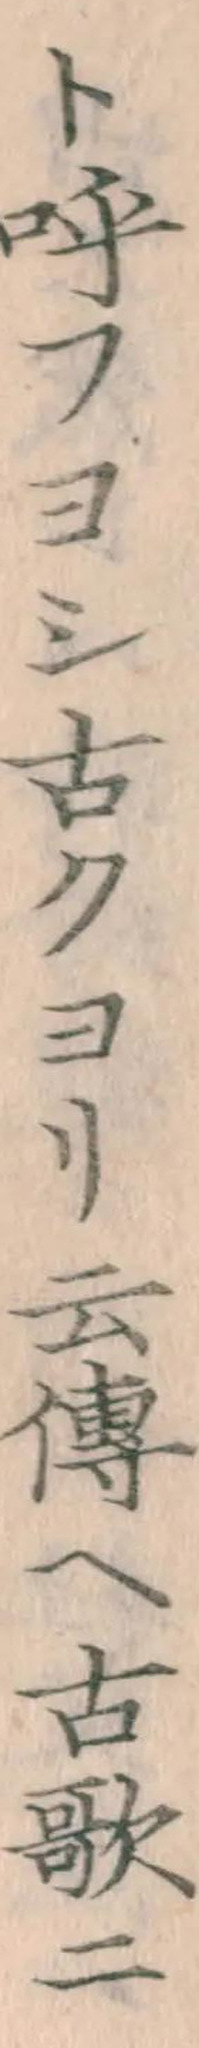ト呼フヨシ古クヨリ云伝ヘ古歌ニ
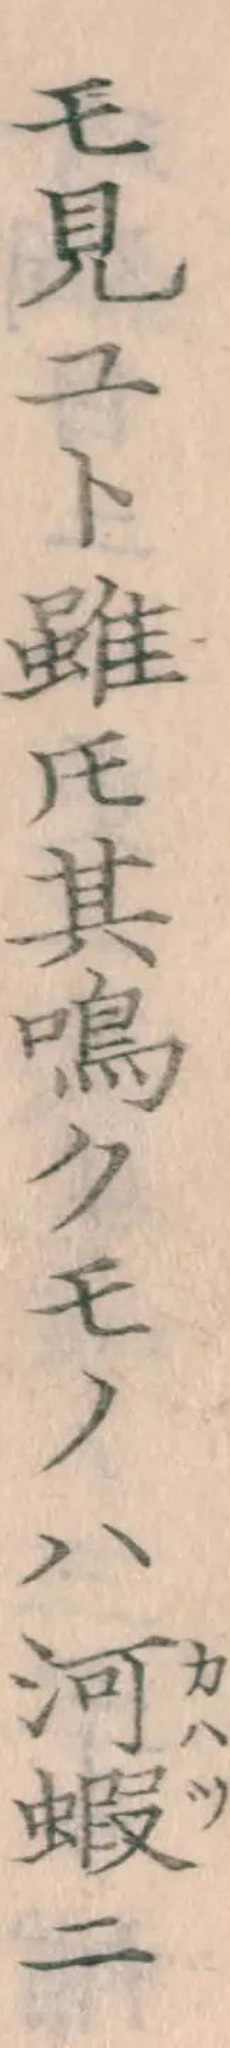モ見ユト雖トモ其鳴クモノハ河蝦ニ
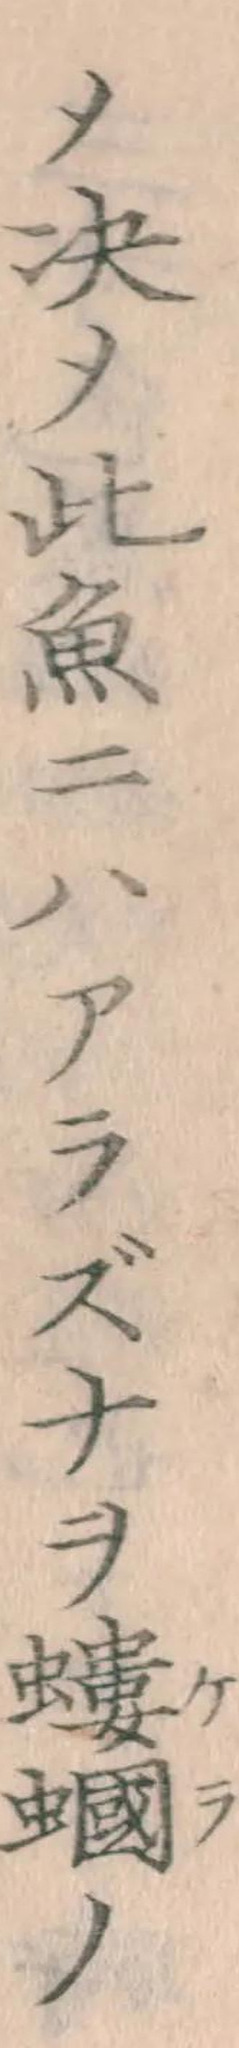シテ決シテ此魚ニハアラズナヲ螻蟈ノ
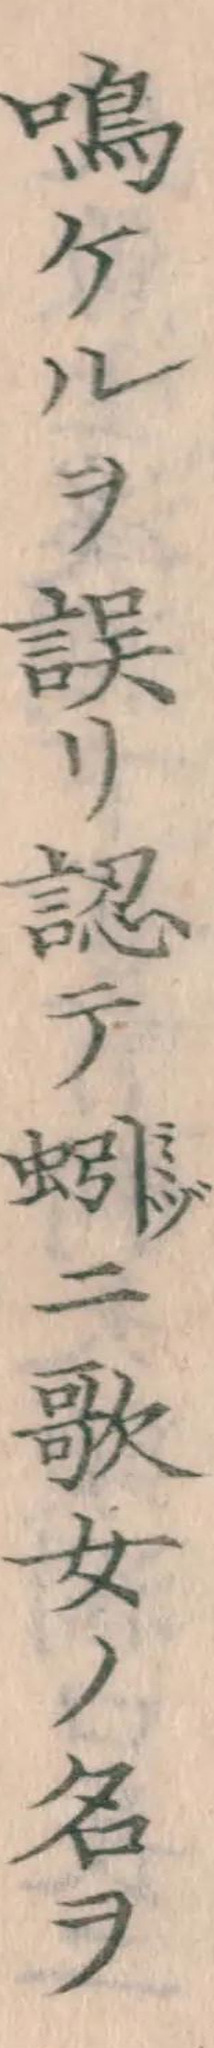鳴ケルヲ誤リ認テ蚓ニ歌女ノ名ヲ
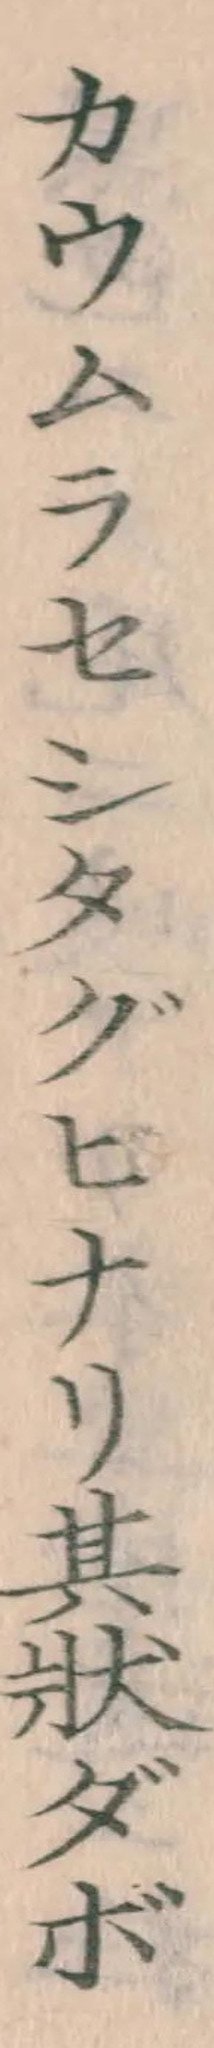カウムラセシタグヒナリ其状ダボ
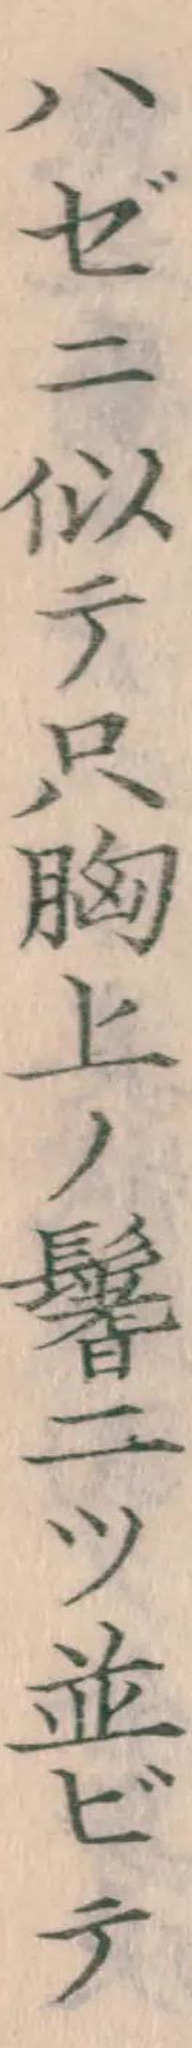ハゼニ似テ只胸上ノ鬐二ツ並ビテ
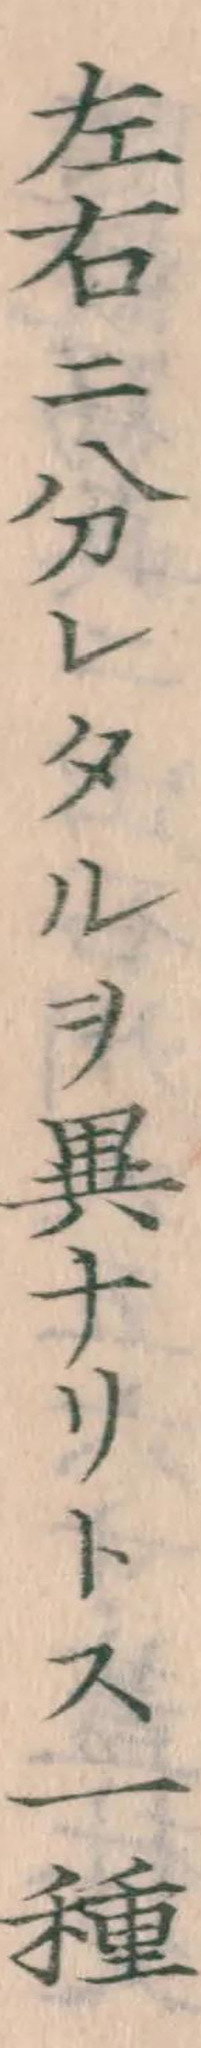左右ニ分レタルヲ異ナリトス一種
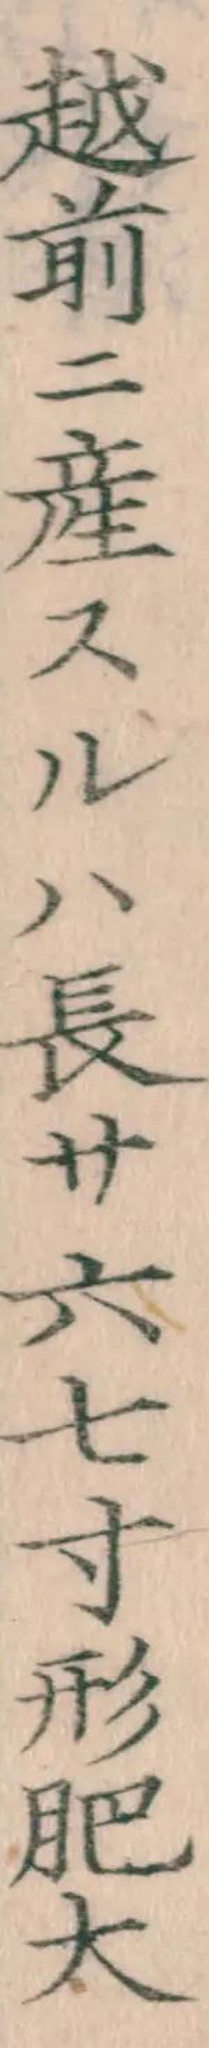越前ニ産スルハ長サ六七寸形肥大
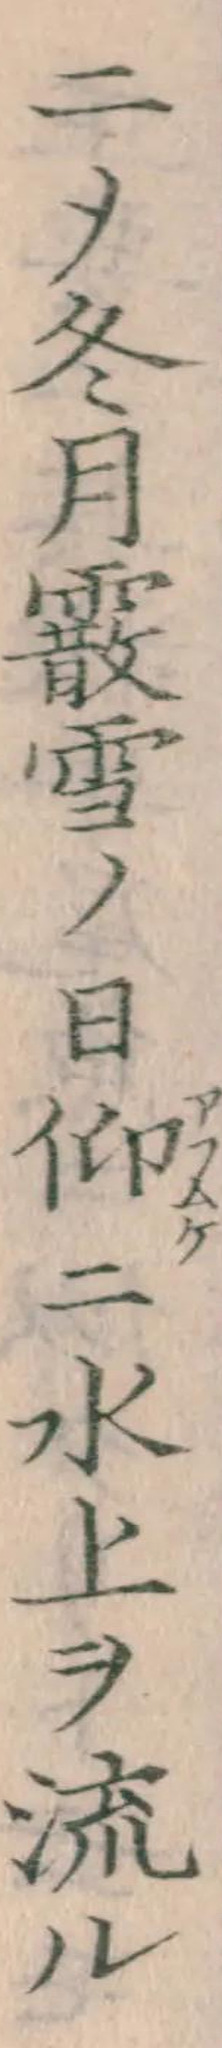ニシテ冬月霰雪ノ日仰ニ水上ヲ流ル
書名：皇和魚譜 2巻
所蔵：国立国会図書館 National Diet Library, JAPAN
